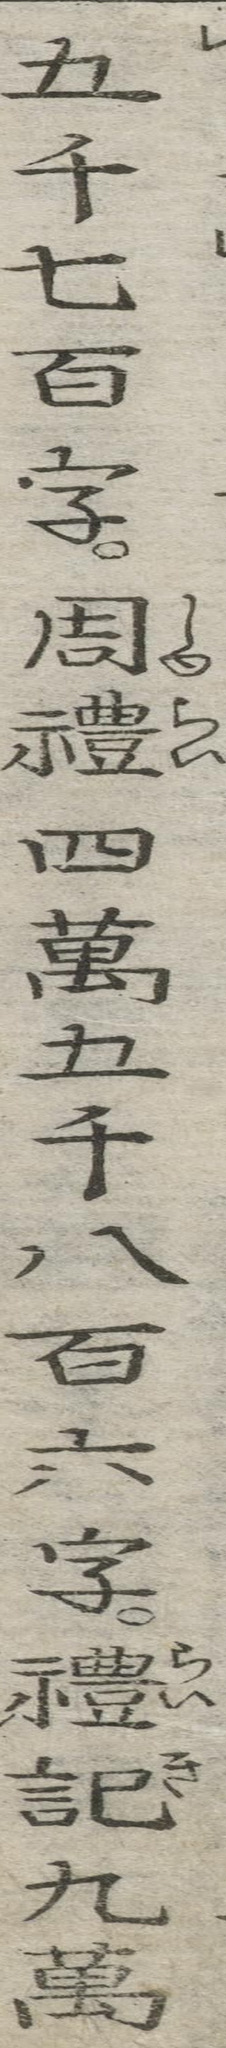五千七百字。周礼四万五千八百六字。礼記九万
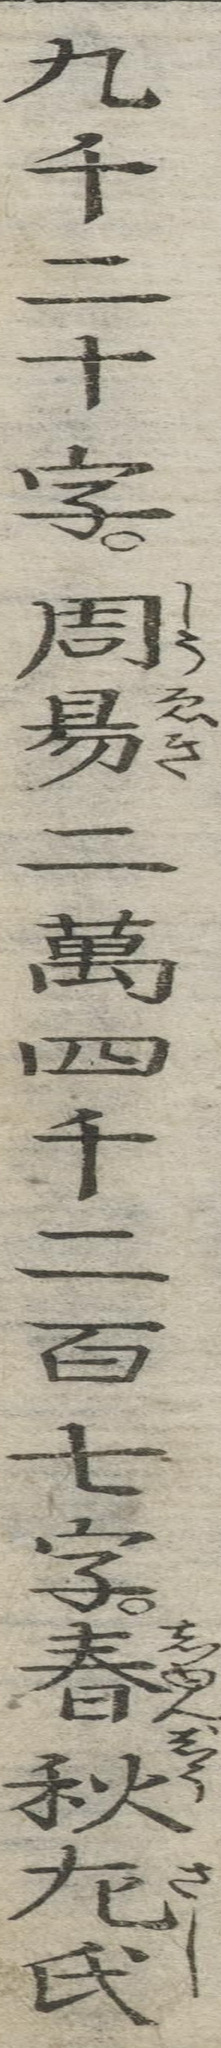九千二十字。周易二万四千二百七字。春秋左氏

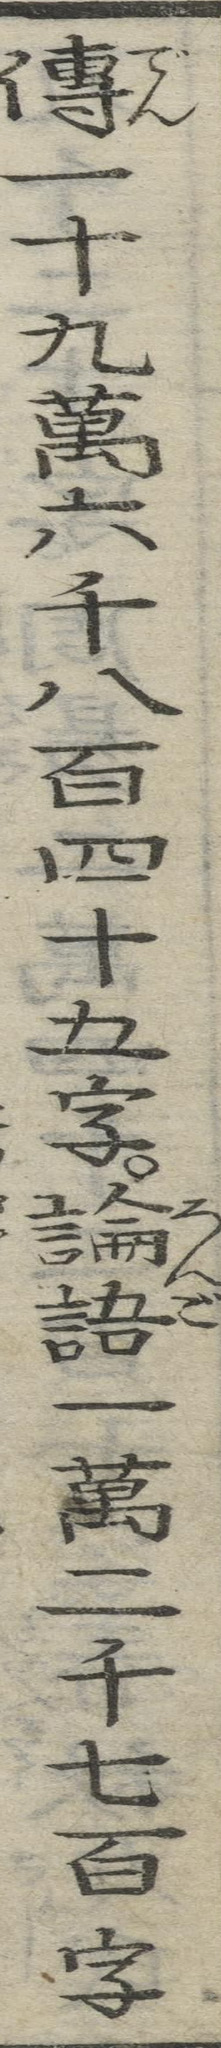傳一十九萬六千八百四十五字。論語一萬二千七百字
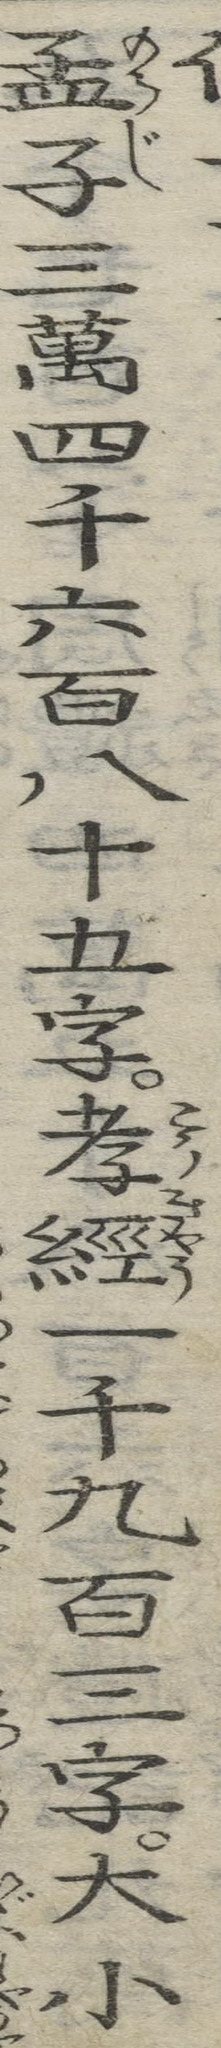孟子三萬四千六百八十五字。孝經一千九百三字。大小
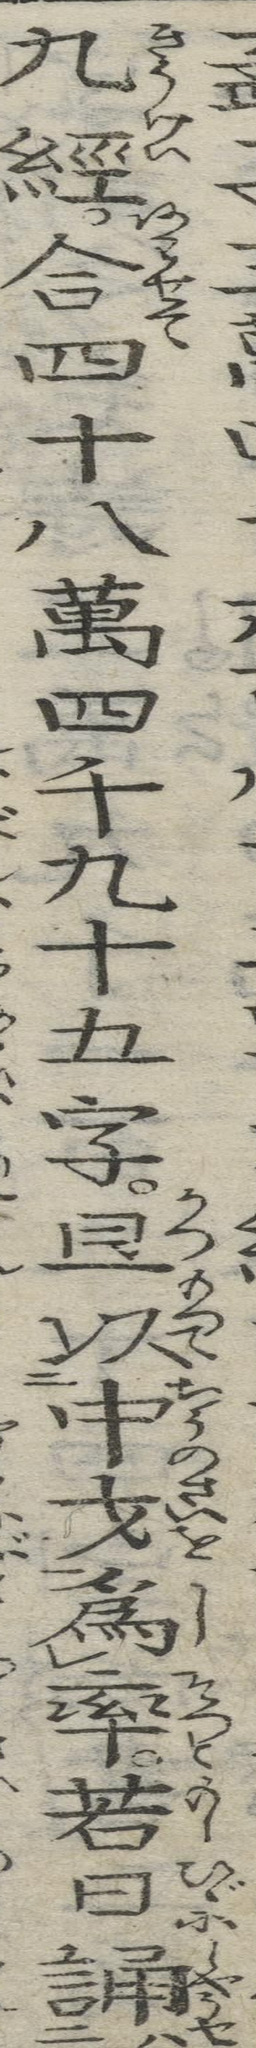九經。合四十八萬四千九十五字。且以中才為率。若日誦
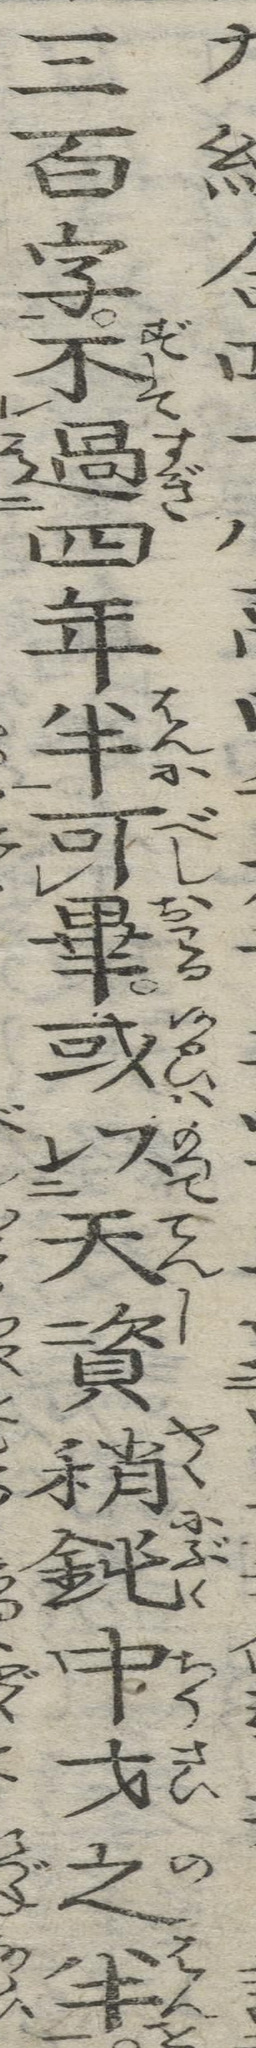三百字。不過四年半可畢。或以天資稍鈍中才之半。
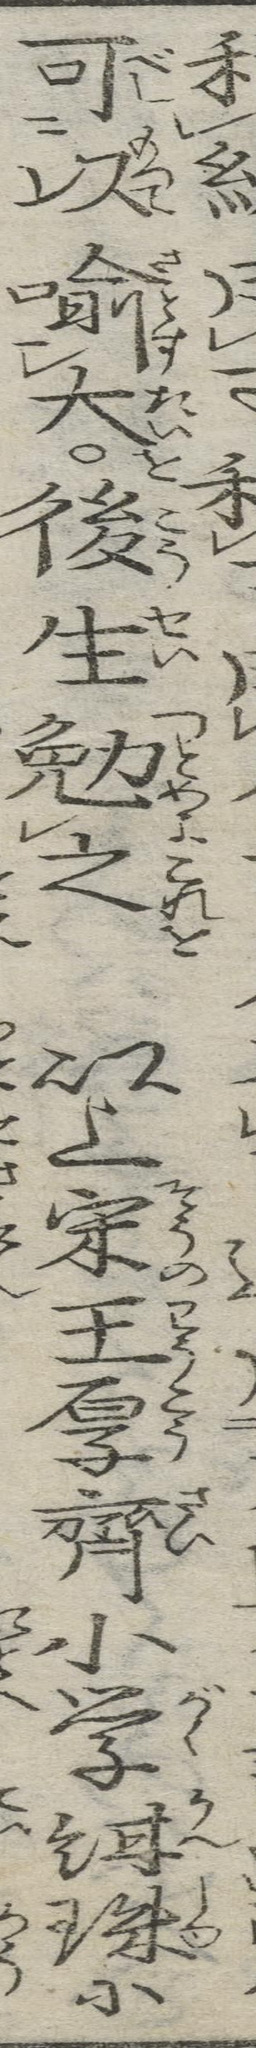可以喩大。後世勉之以上宋王厚斎小学紺珠に
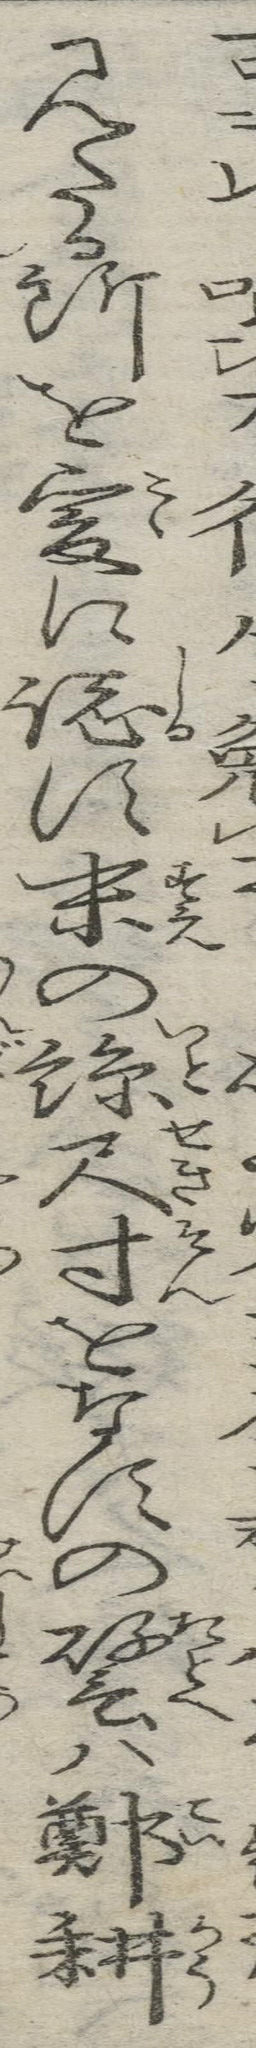みへたる所を爰に誌す末の絲尺寸をなすの譬は鄭耕
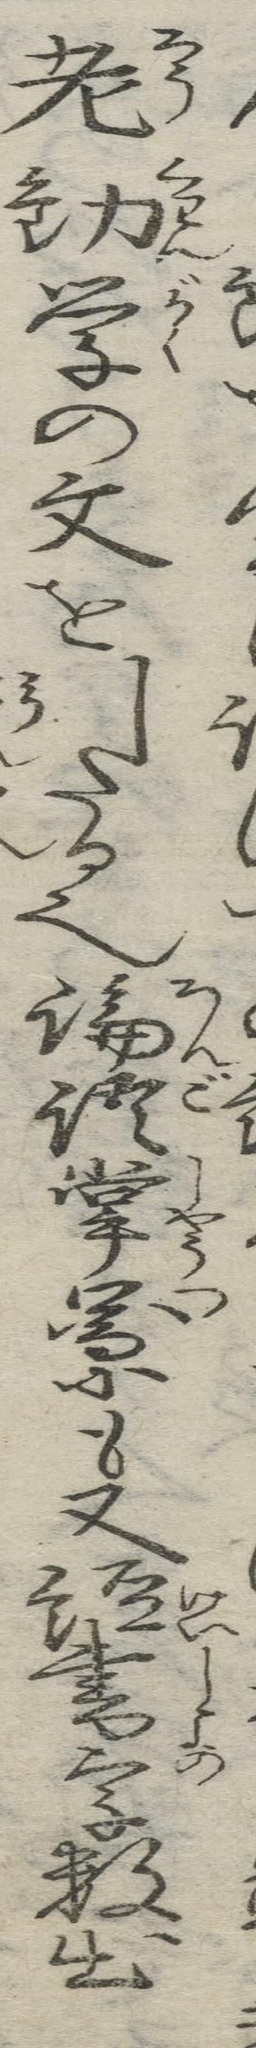老勧学の文を引たる也論語掌圖にも又経書字数出
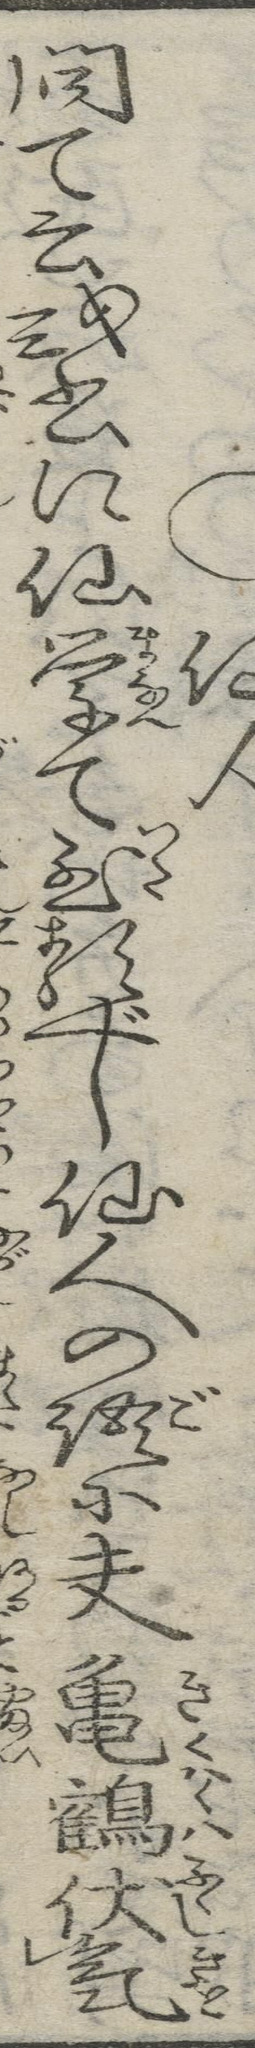問て云或書に仙学て至る人べし仙人の語に夫亀鶴伏気
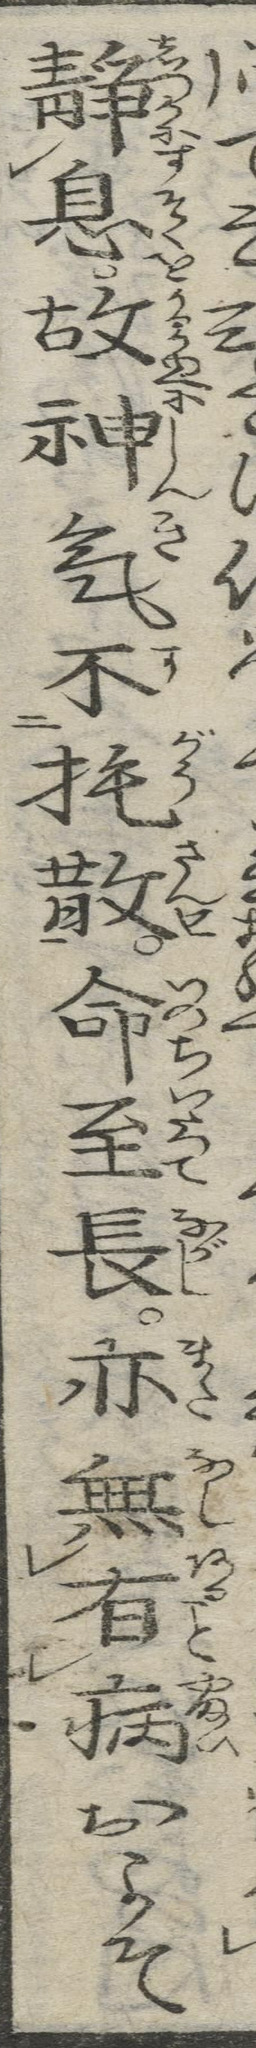静息。故神気不耗散。命至長。亦無有病およそ
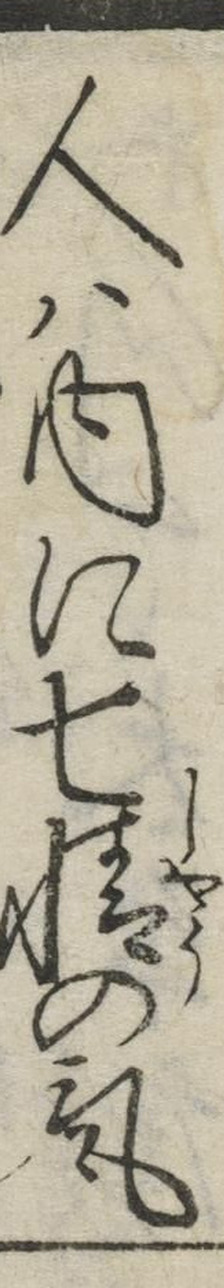人は内に七情の気
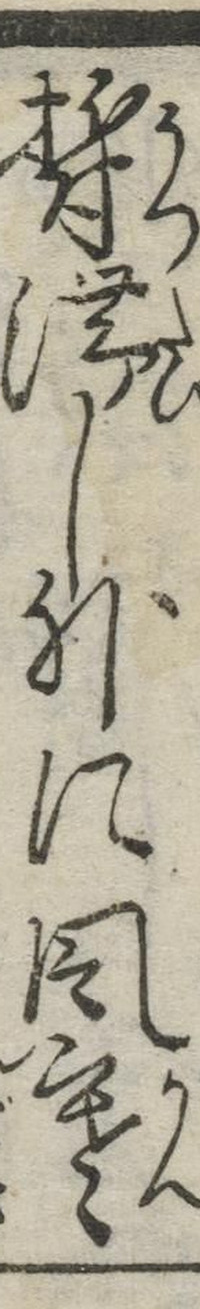欝滞し神に風寒
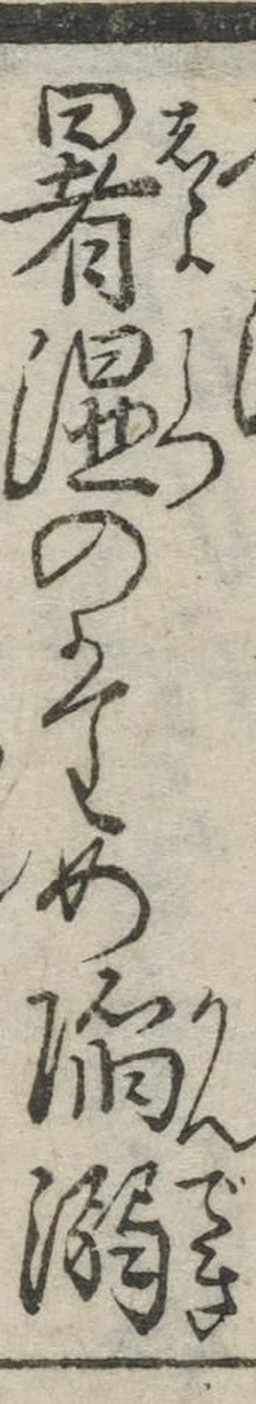暑湿のため陥溺
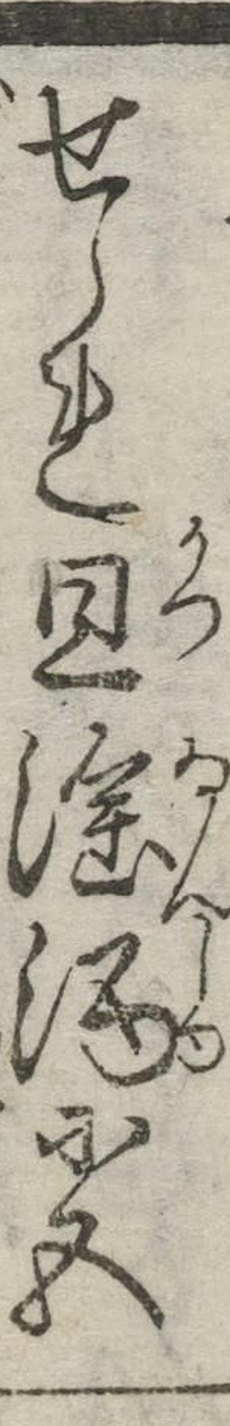せられ且淫酒に五
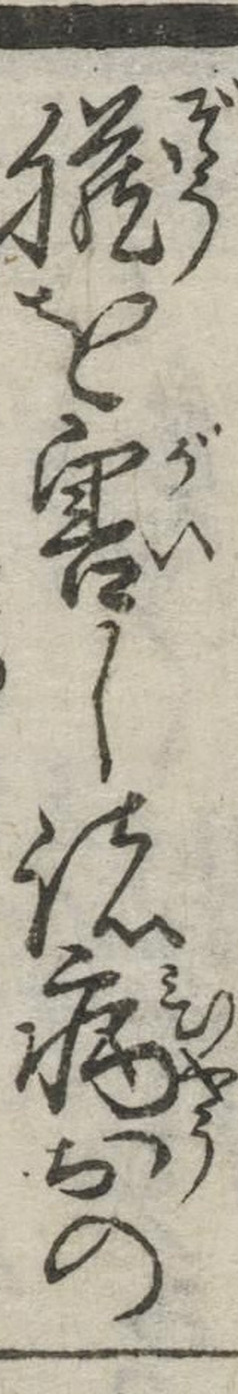臓を害し諸病おの
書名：訓蒙天地辨　人
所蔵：東京大学地震研究所図書室 Earthquake Research Institute Library, The University of Tokyo, JAPAN
